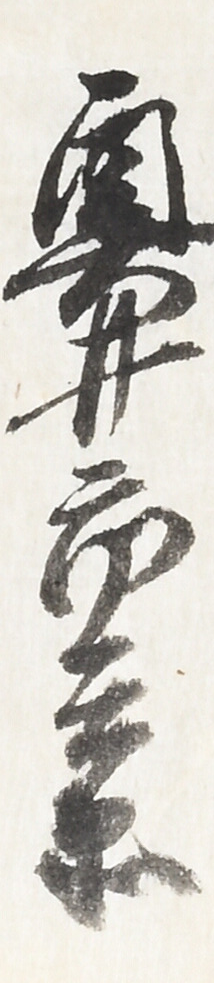奥井市兵衛
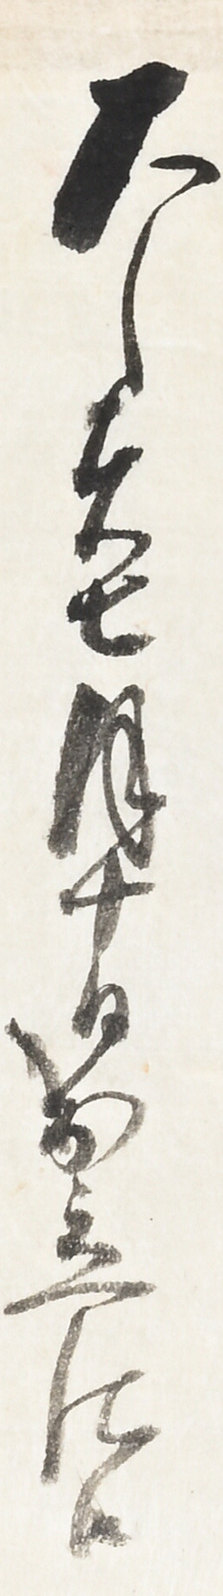右之者七月十日出立仕候
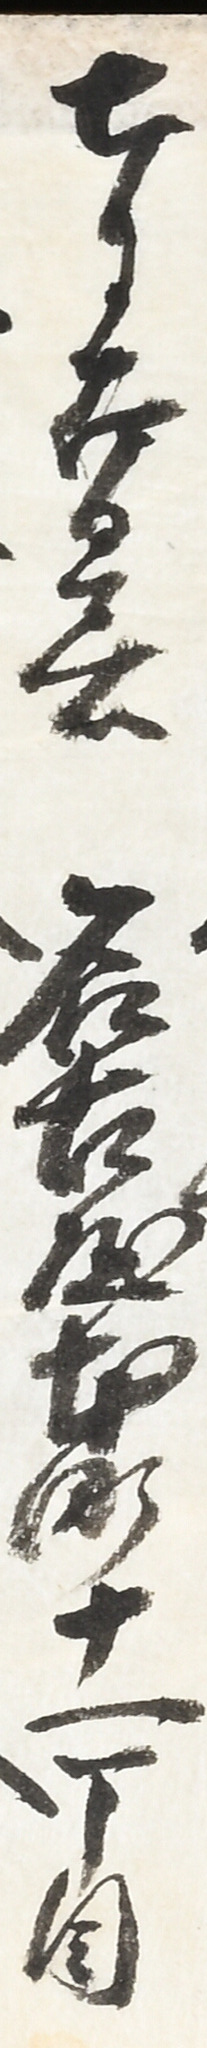七月十四日着名古屋本町十一丁目
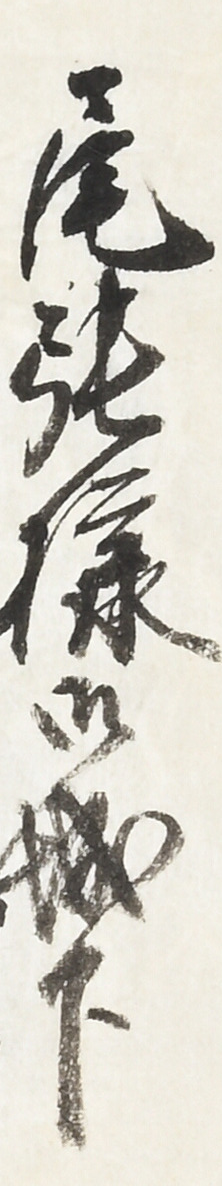尾張様御城下
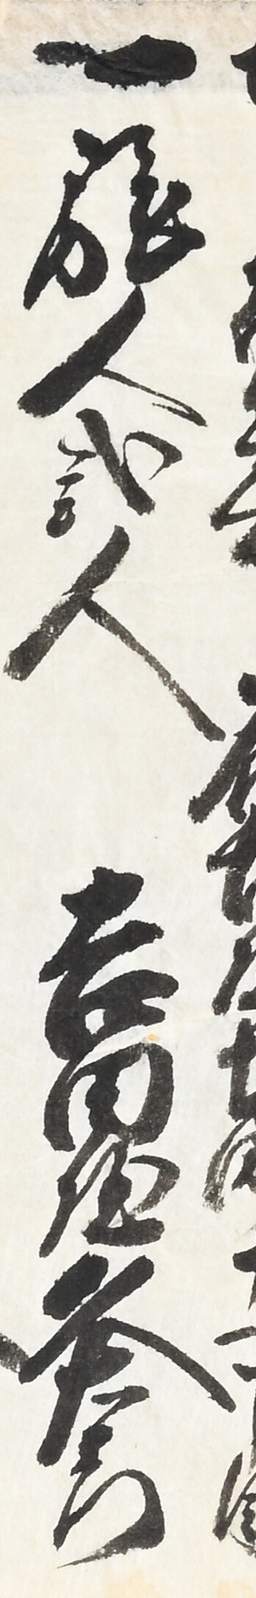一旅人弐人吉田屋久右衛門
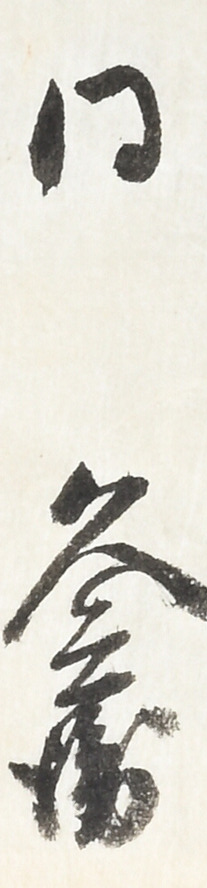同久兵衛
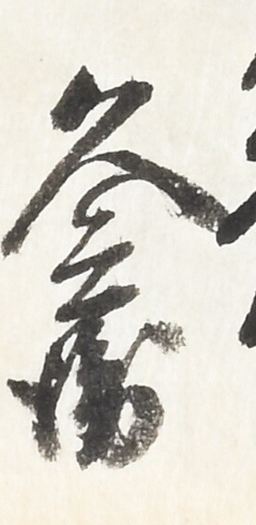同久兵衛
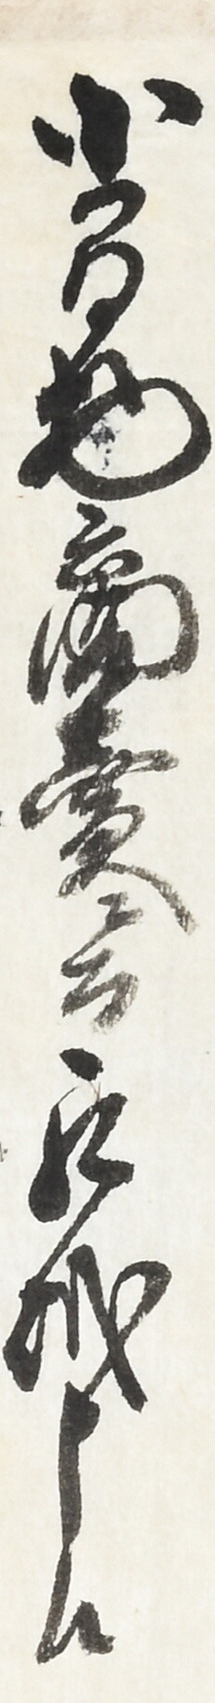小間物商売ニ而罷越申候
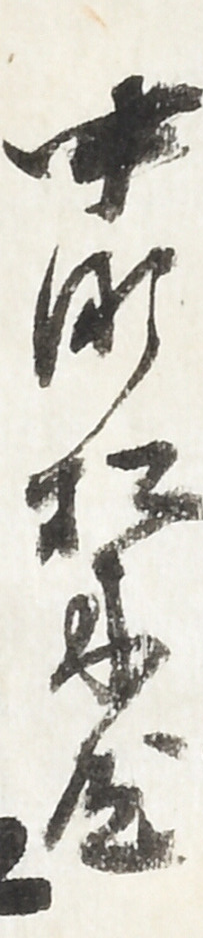中町松木屋
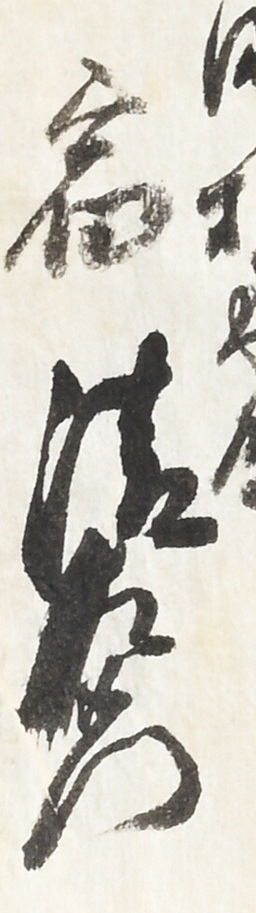宿清左衛門

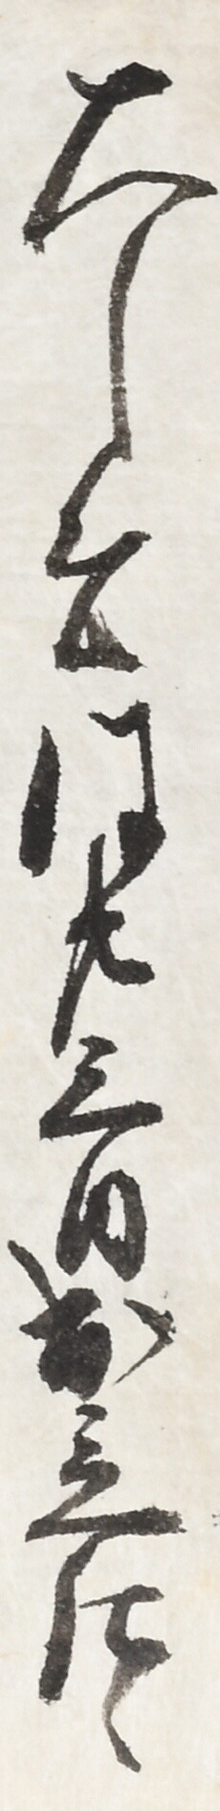右之者同廿三日出立仕候
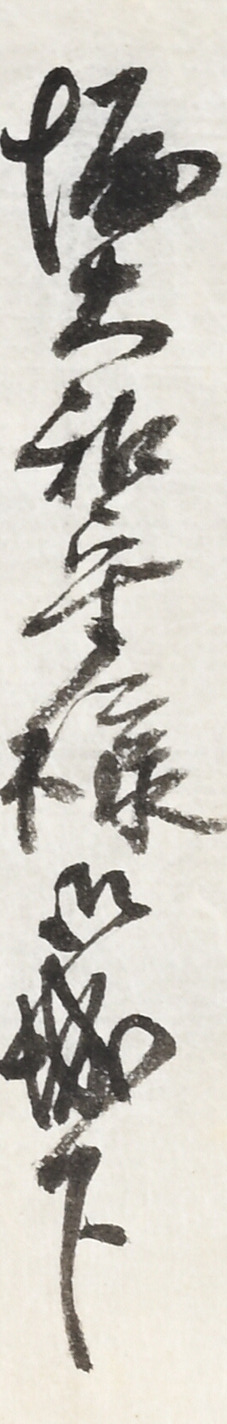堀大和守様御城下
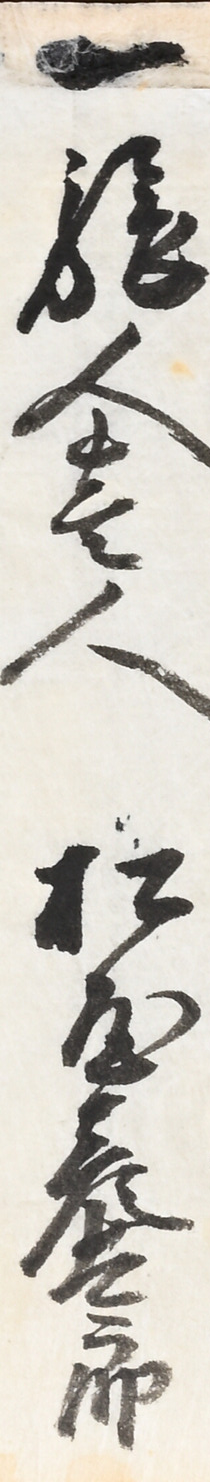一旅人壱人松屋彦太郎
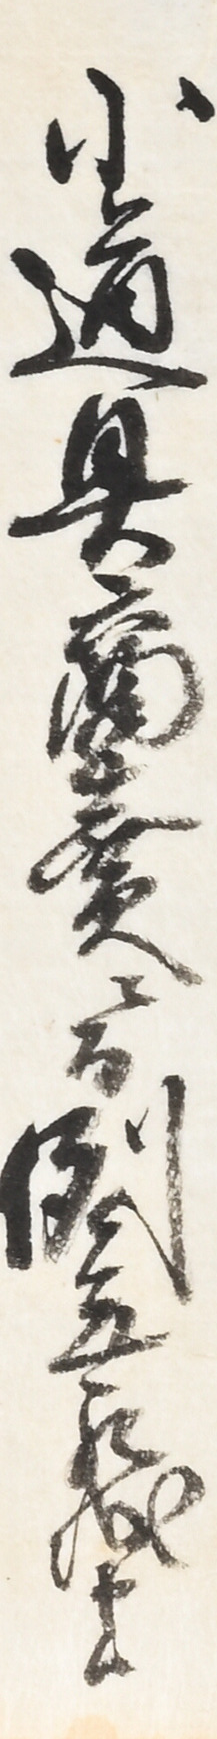小道具商売ニ而例年罷越申候
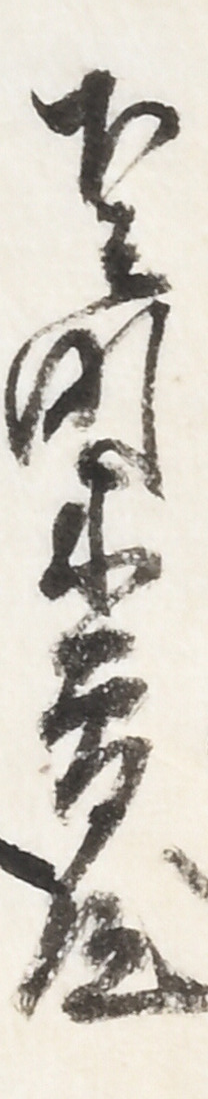下モ町木曽屋
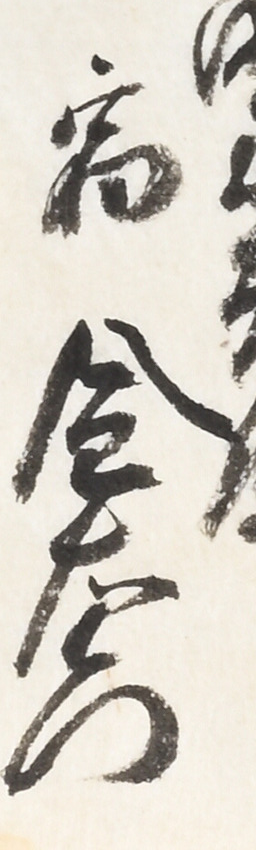宿金右衛門
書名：旅人泊控帳
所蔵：伊那市立高遠町図書館・合同会社AMANE
